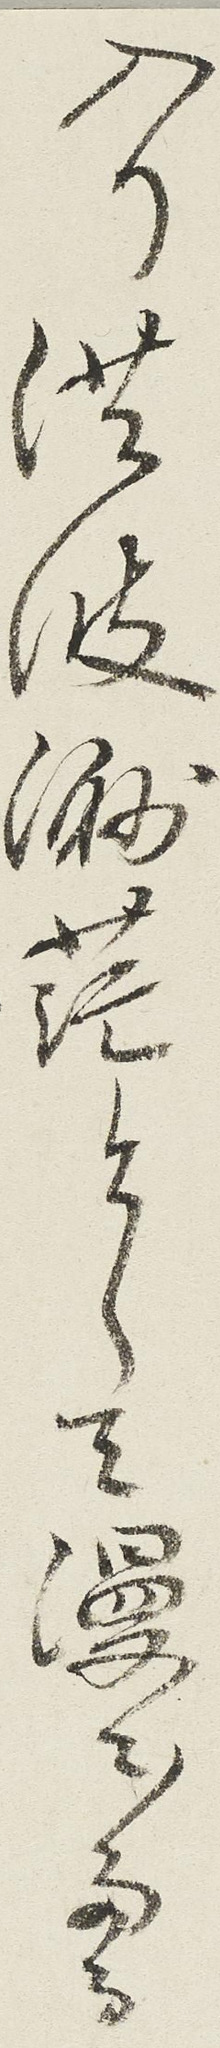入り洪波渺茫として漫々たる
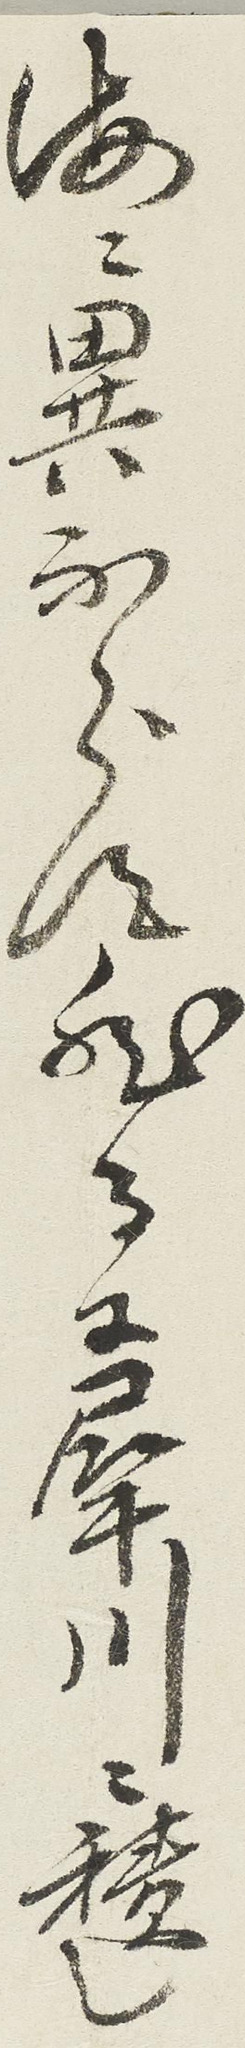海ニ異ならす然るに犀川ニ積し
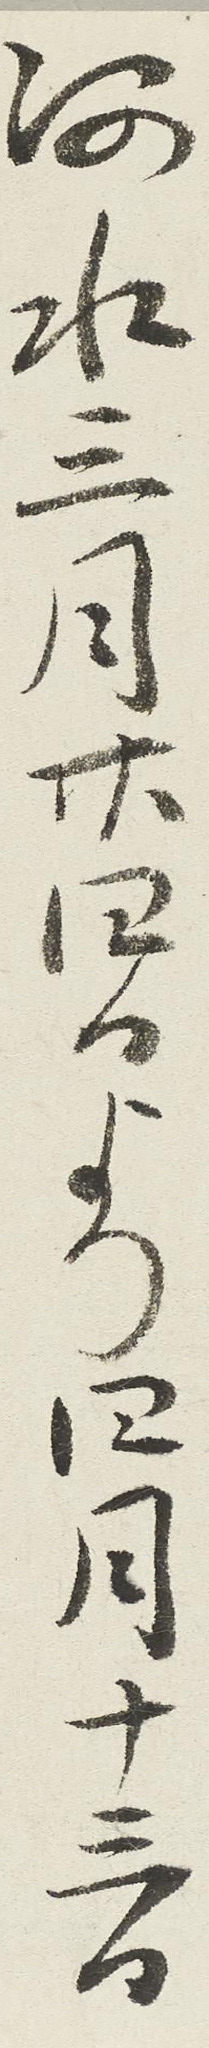河水三月廿四日より四月十三日
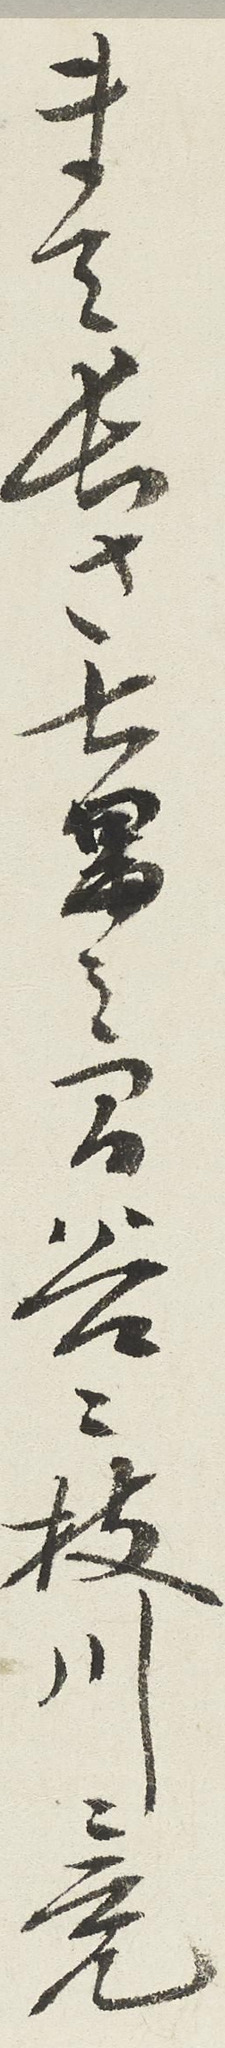まて長さ七里之間谷ニ枝川ニ充
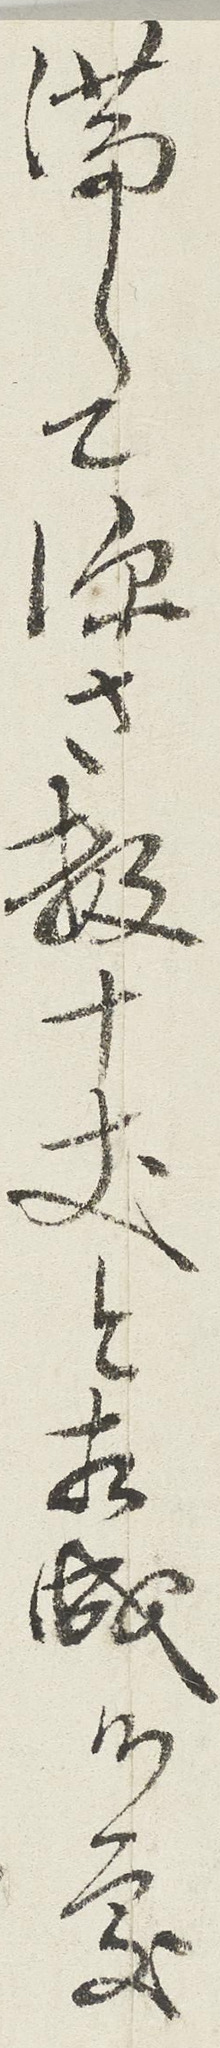満して深さ数十丈と相成候処
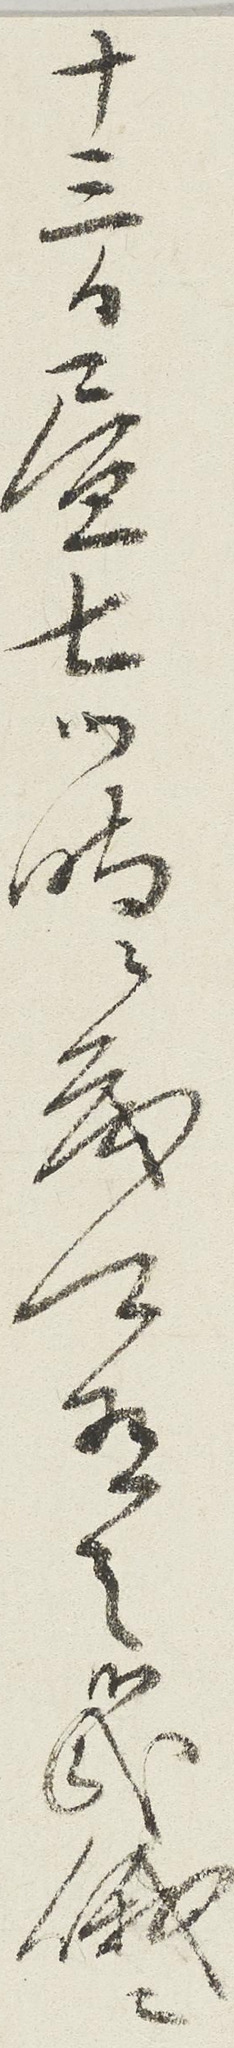十三日昼七ツ時ニも可有之候哉俄ニ
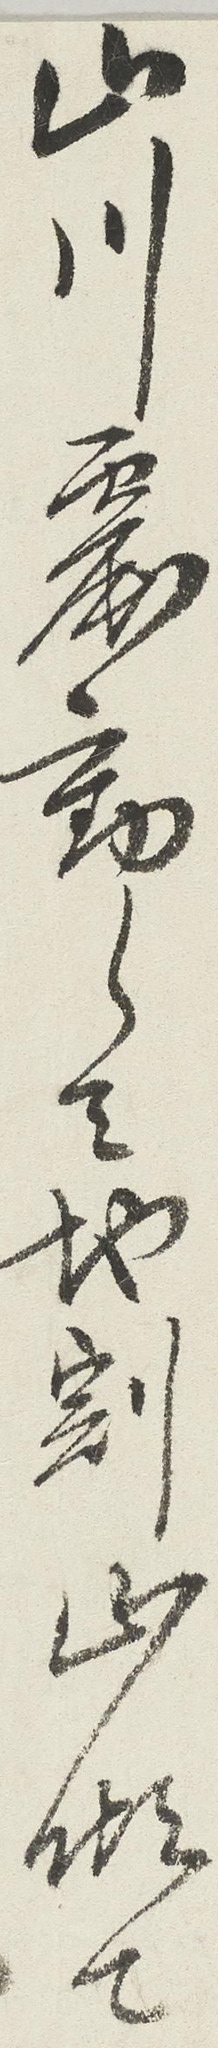山川震動して地割山傾て
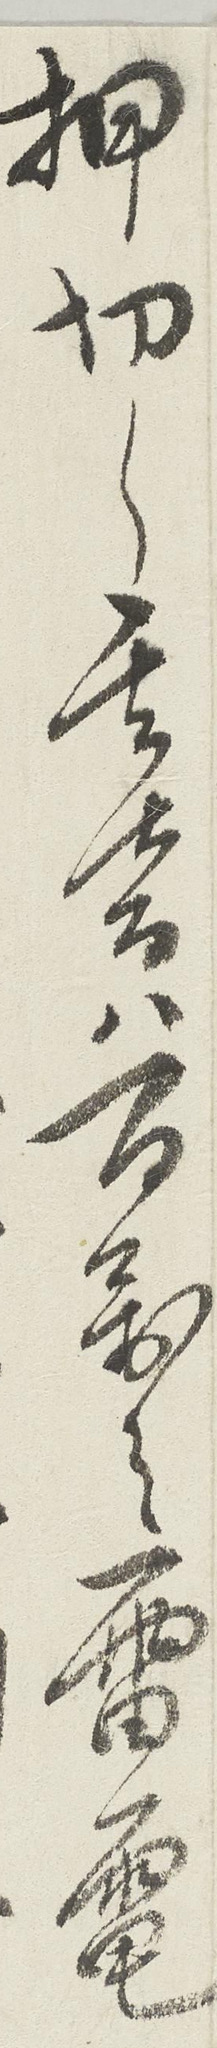押切候其音は百万之雷電
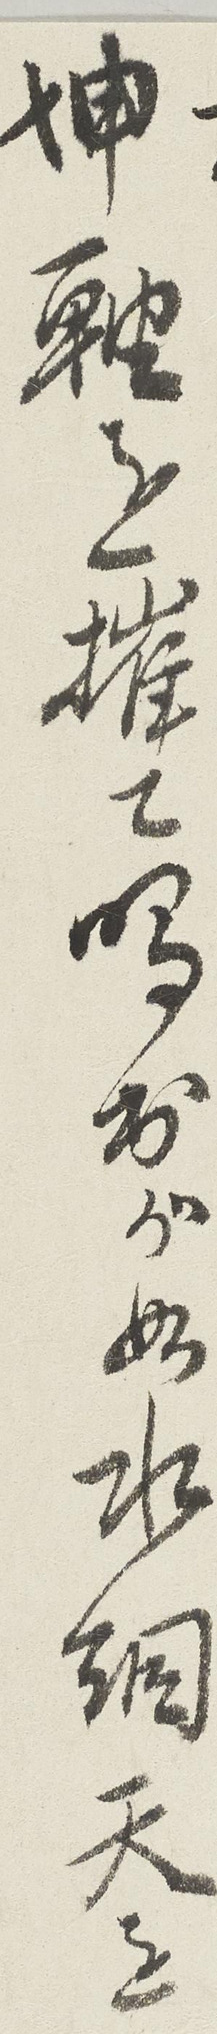坤軸を摧て鳴出が如水煙天を
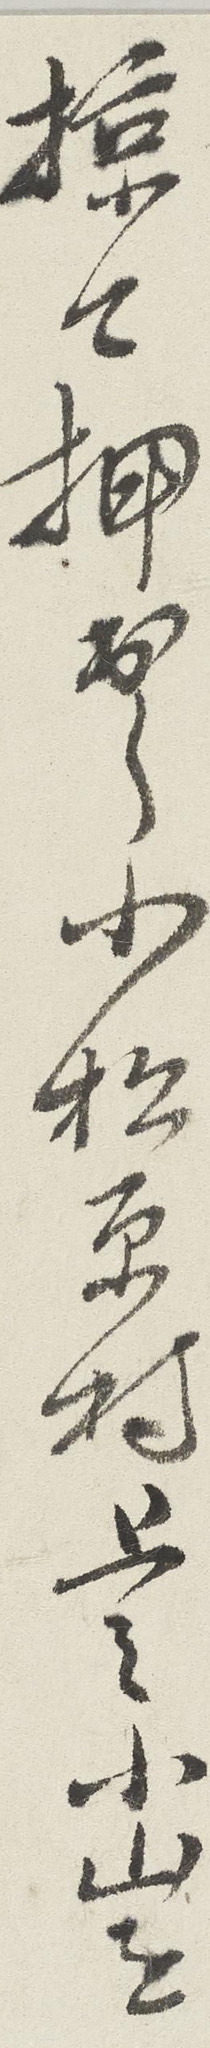掠て押出候小松原村上は小山を
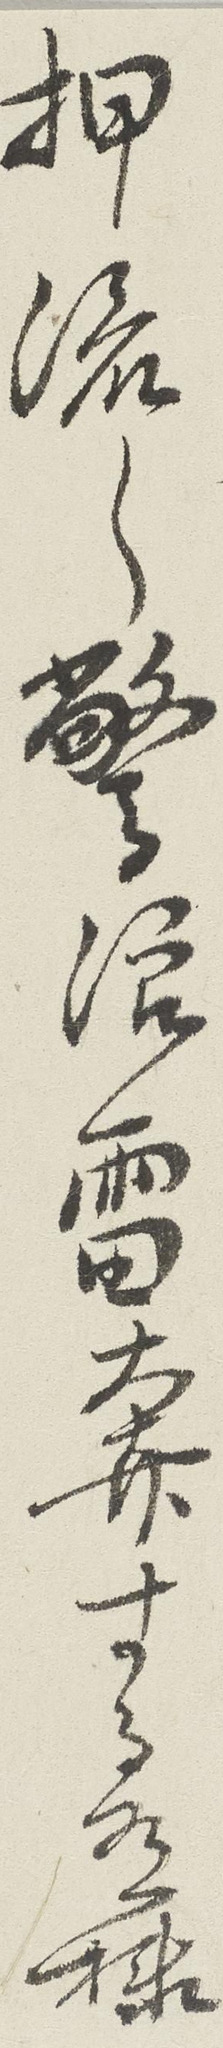押流候驚浪雷奔する有様
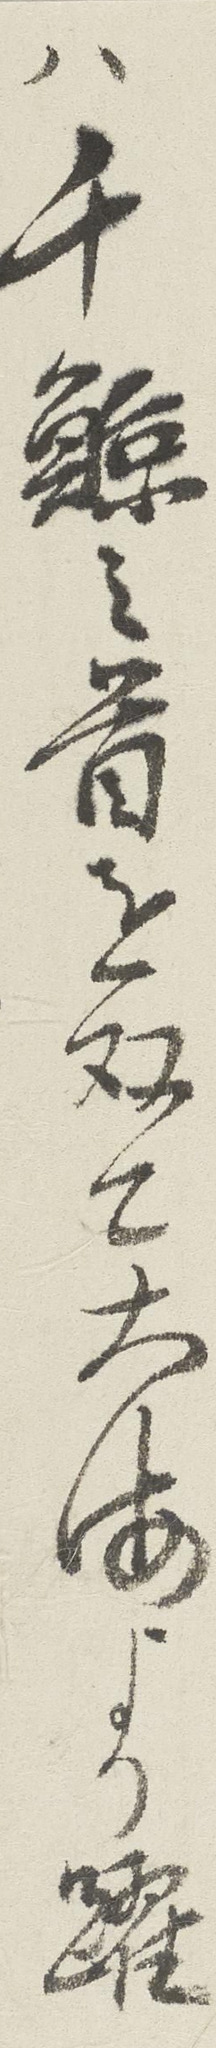は千鯨之首を双て大海より躍
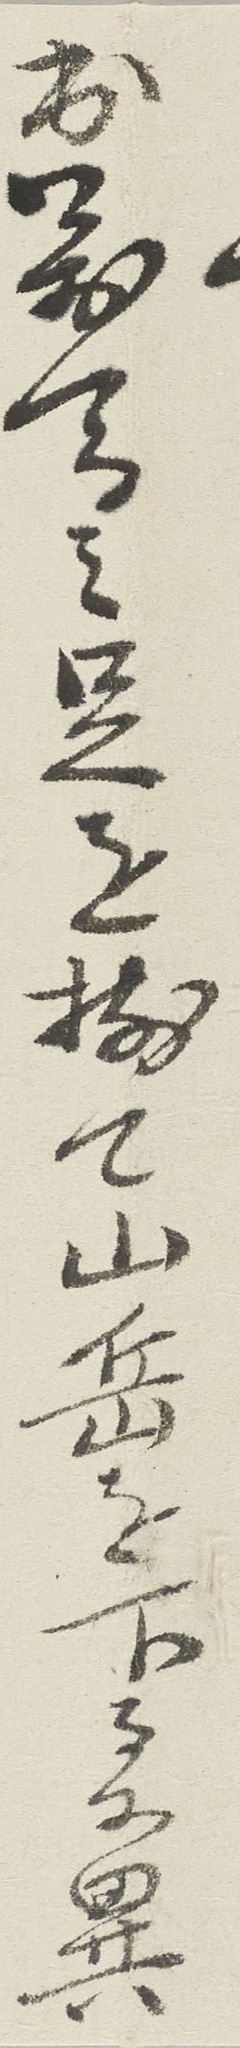出万馬之足を揃て山岳を下るに異
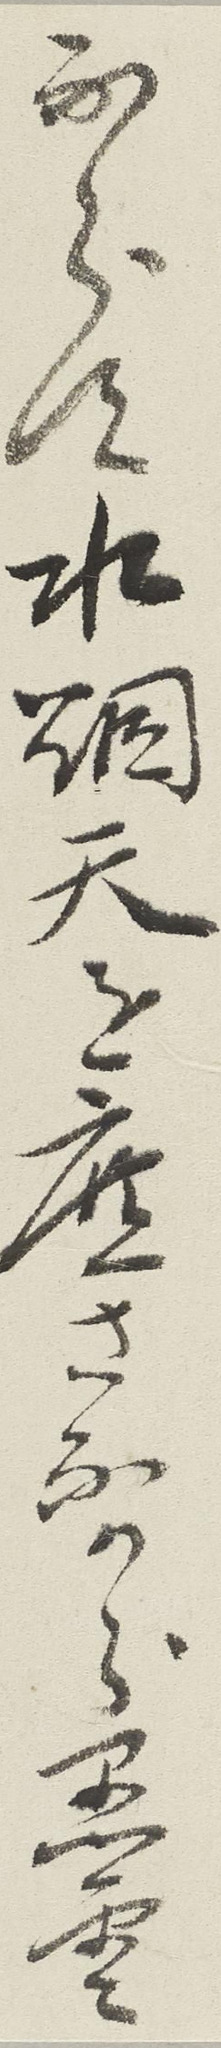ならす水煙天を広さなから黒雲
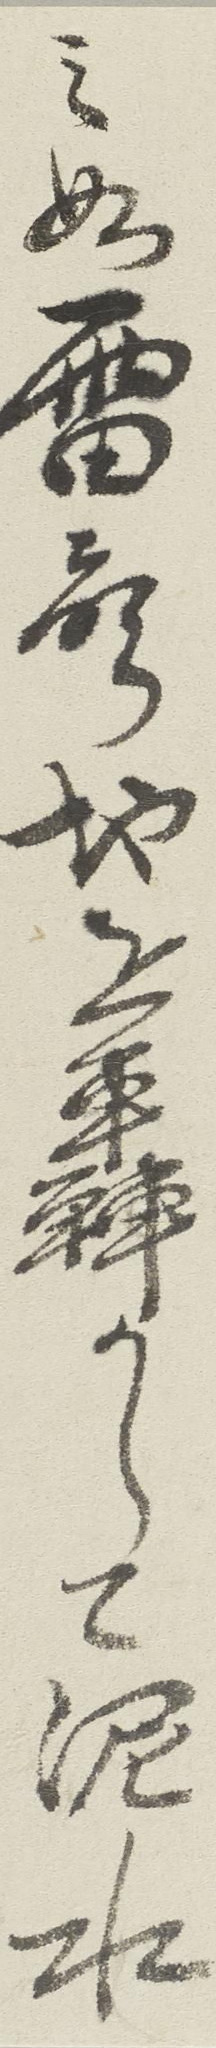之如雷声地を轟かして泥水
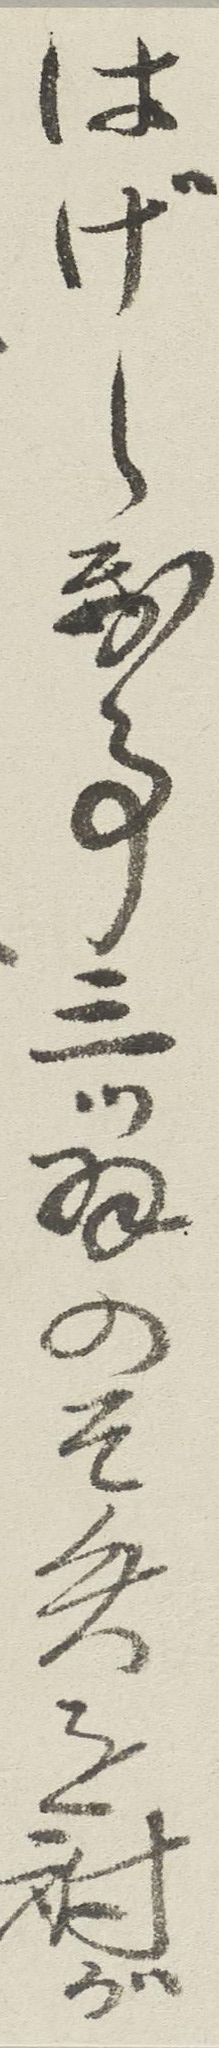はげしき事三ツ羽のそ矢を射が
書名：[善光寺地震に関する書状]
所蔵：東京大学地震研究所図書室 Earthquake Research Institute Library, The University of Tokyo, JAPAN
